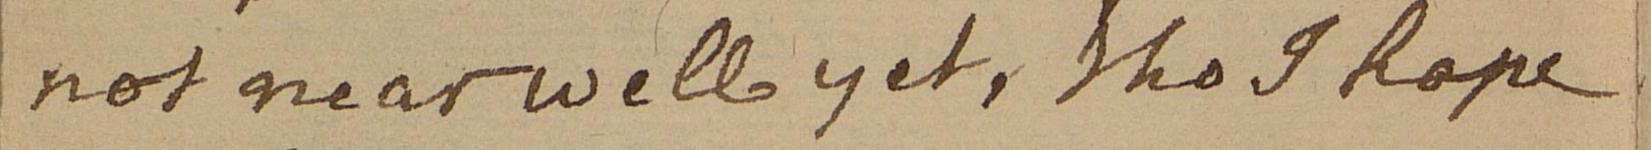not near well yet, tho I hope
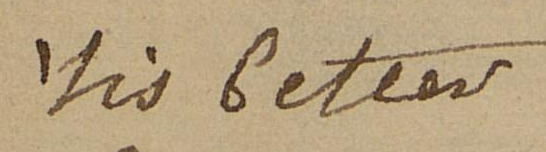'tis better
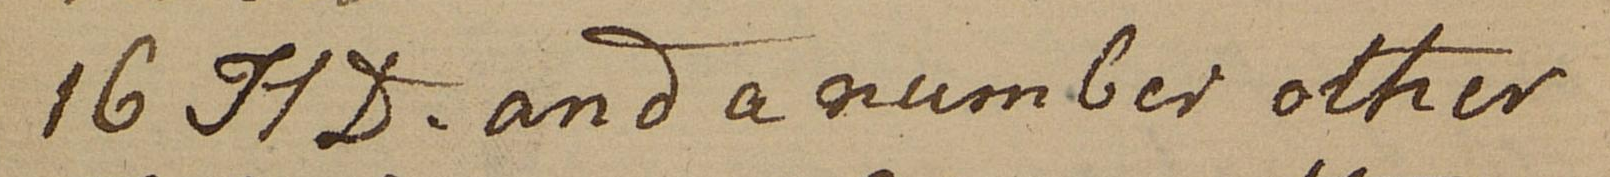16 HD. and a number other
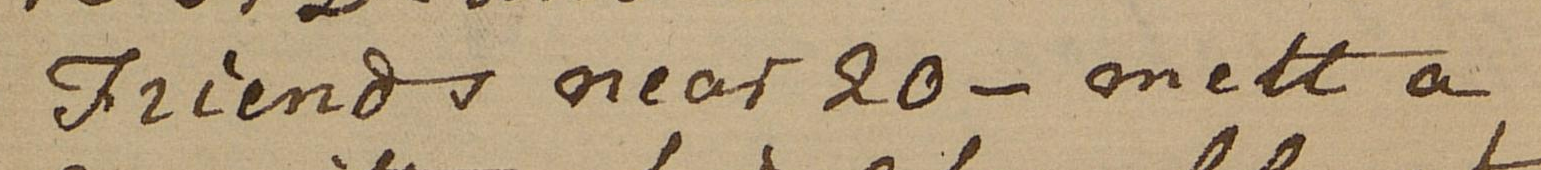Friends near 20- mett a
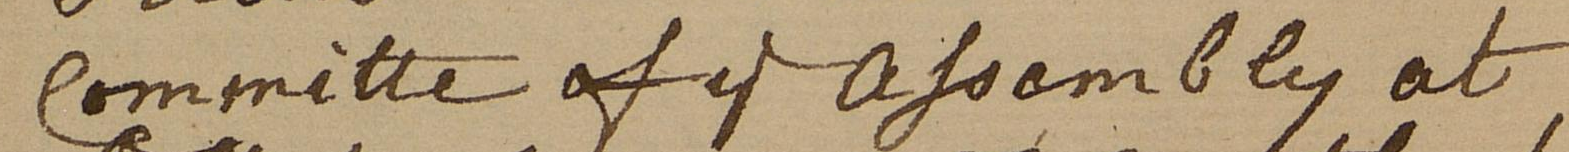Committe of y^e assembly at
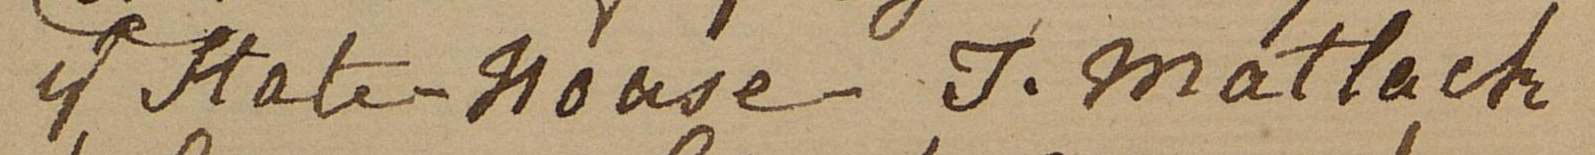y^e Hate-House- T. Matlack
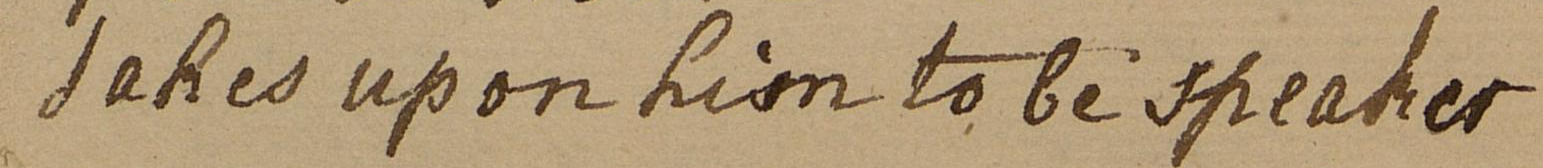takes upon him to be speaker
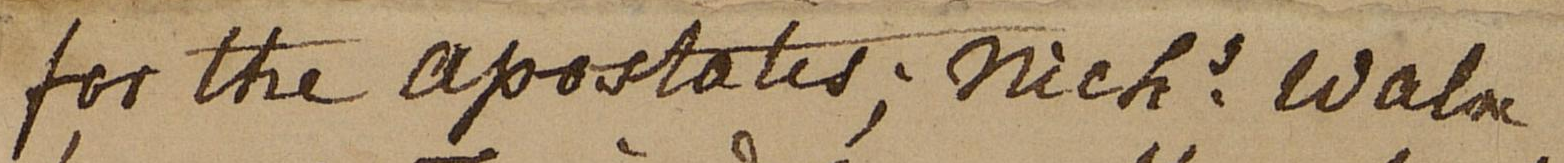for the Apostates; Nich^s. Waln
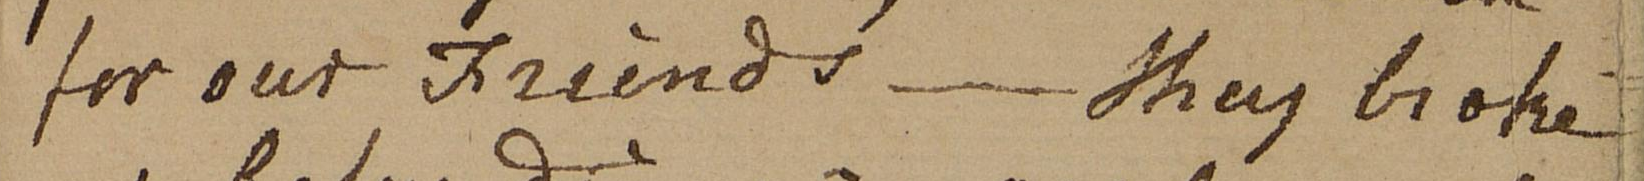for our Friends- they broke
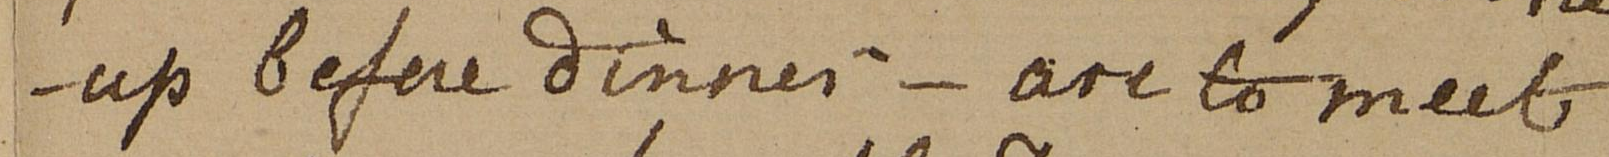-up before dinner- are to meet
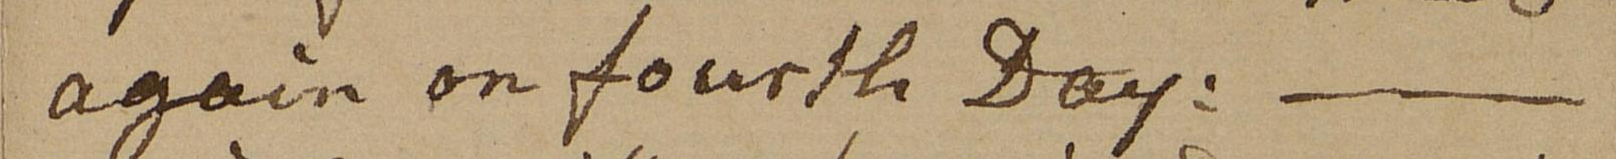again on fourth Day:-
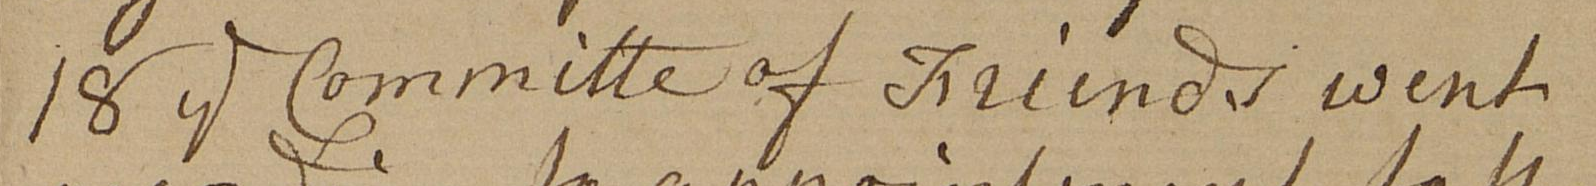18 y^e Committe of Friends went
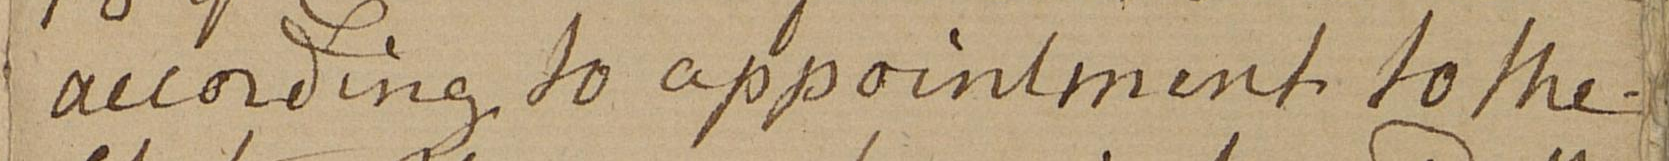according to appoointment to the
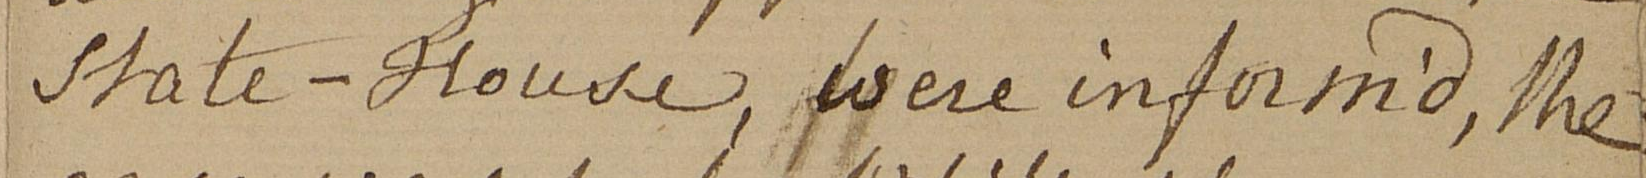State-House, were inform'd, the
